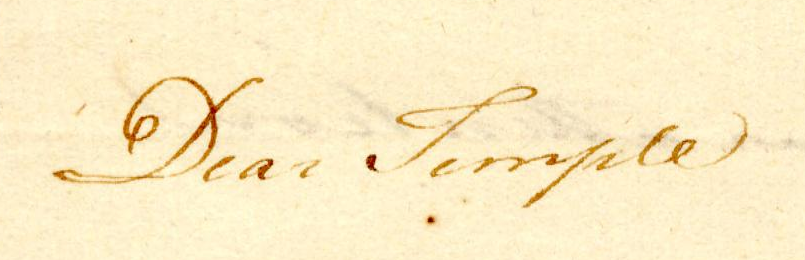Dear Temple
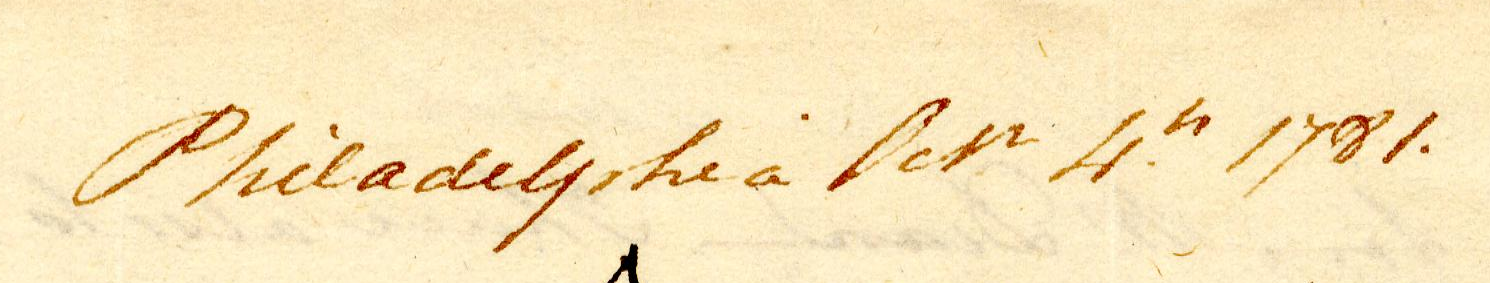Philadelphia Oct^r 4^h. 1781
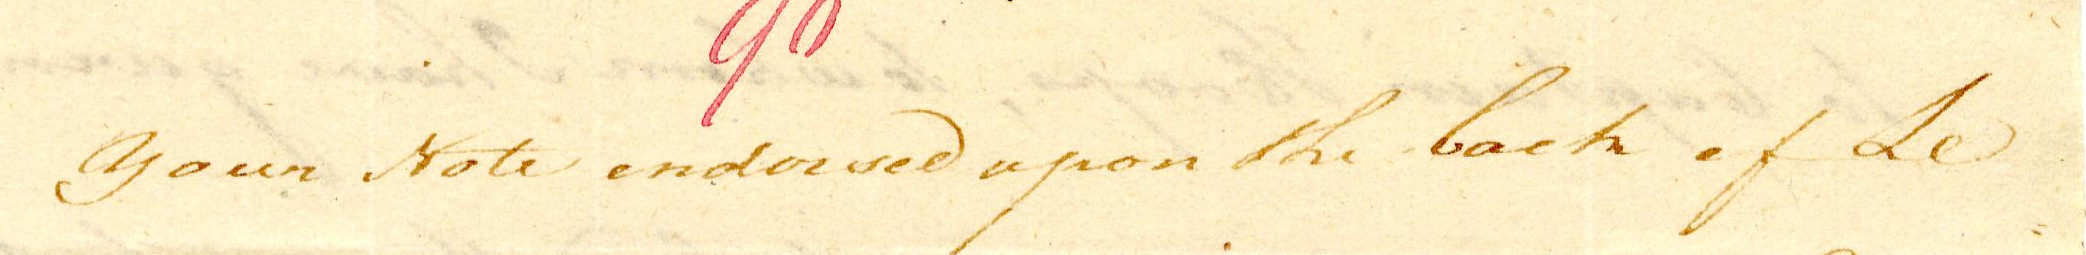Your Note endorsed upon the back of Le
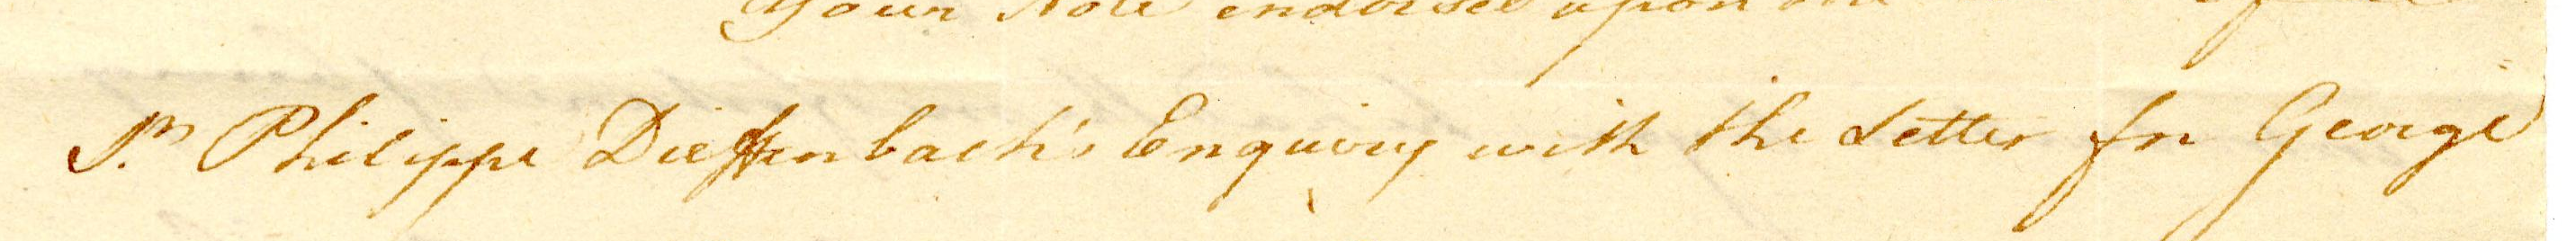J^n. Philippe Dieffenbach's Enquiry with the Letter for George
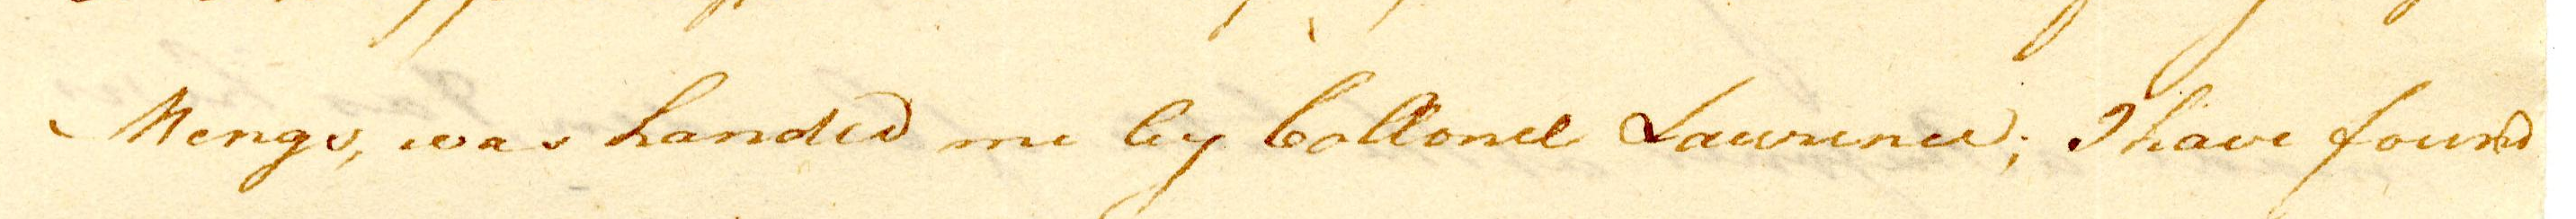Mengs, was handed me by Collonel Lawrence; I have found
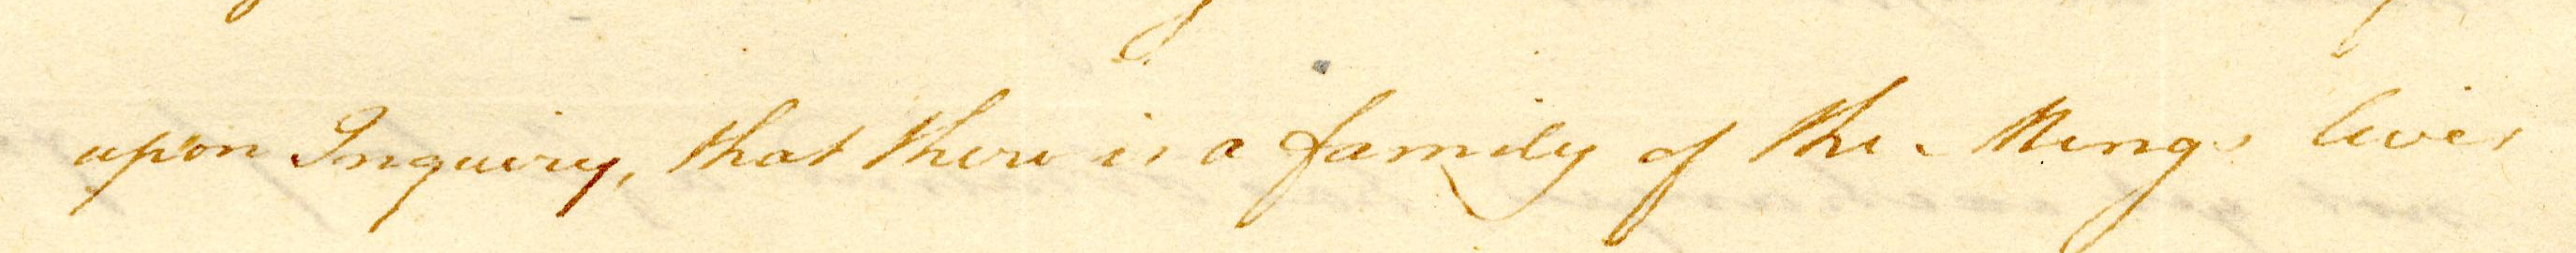upon Inquiry, that there is a family of the Mengs lives
